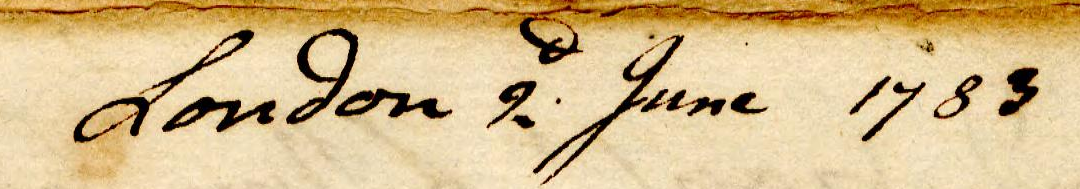London 2^d. June 1783
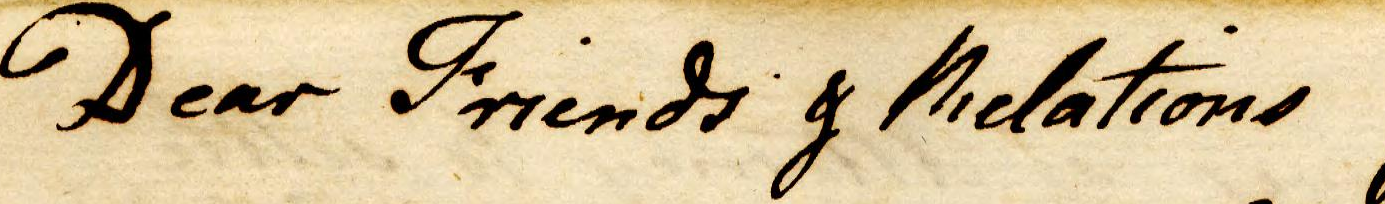Dear Friends & Relations
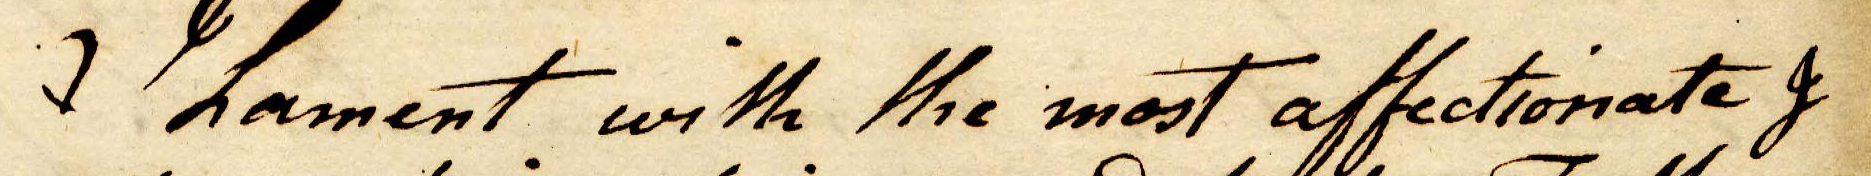Y^e Lament with the most affectionate &
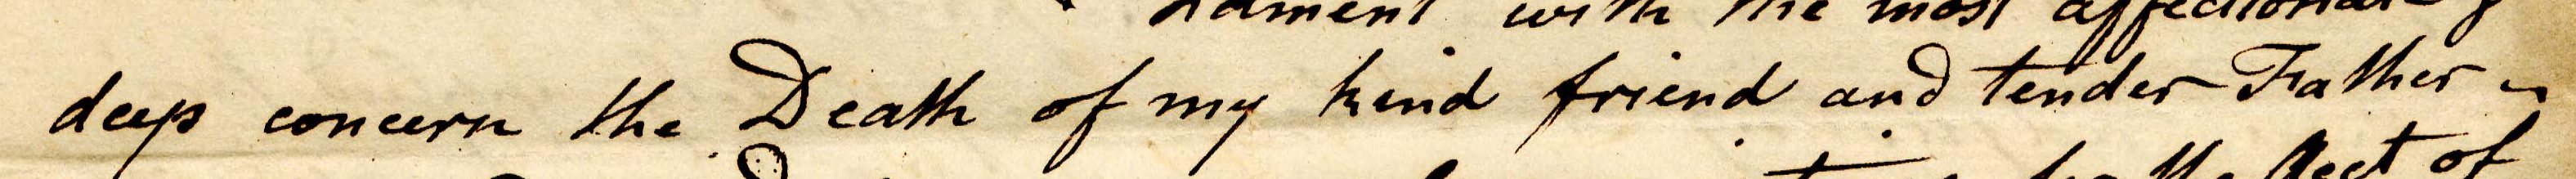deep concern the Death of my kind friend and tender Father
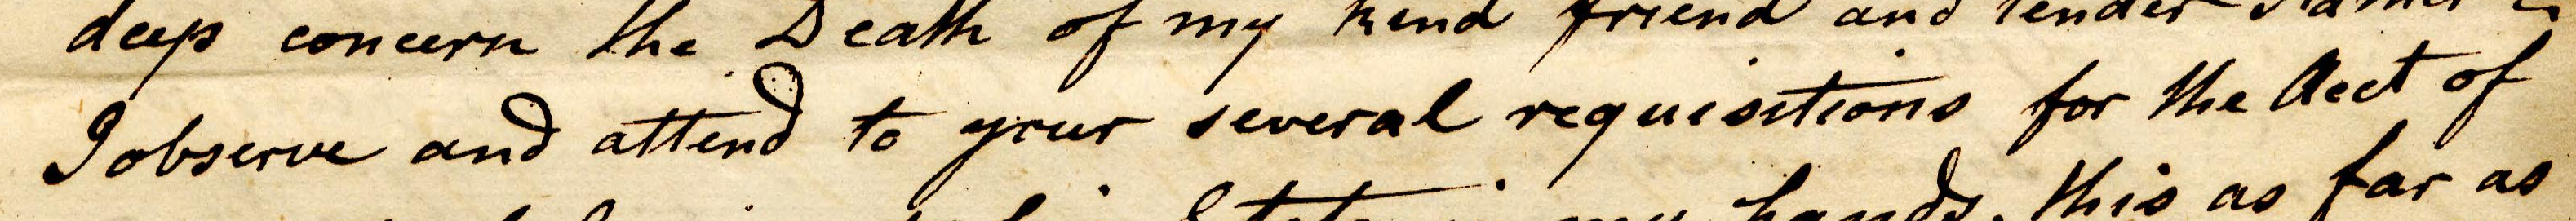I observe and attend to your several requisitions for the Acct of
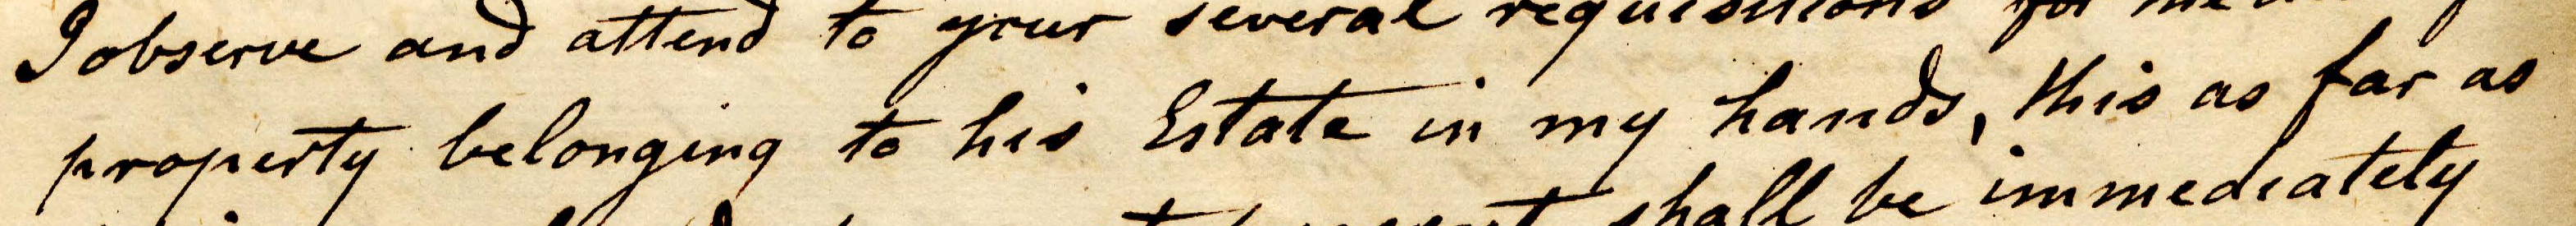property belonging to his Estate in my hands, this as far as
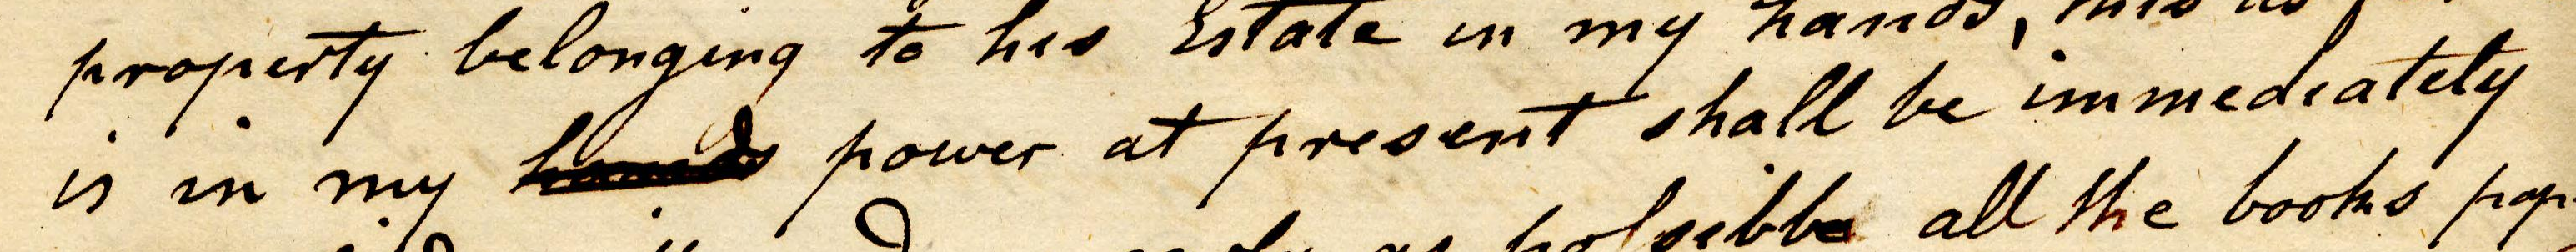is in my [hands] power at present shall be immediately
